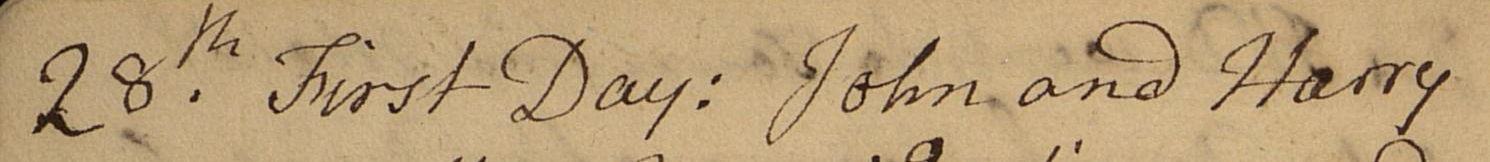28^th First Day: John and Harry
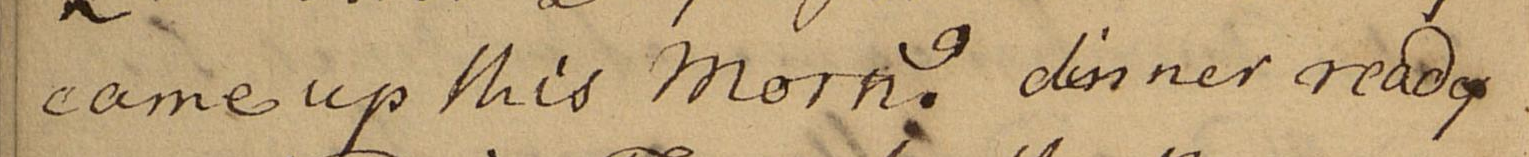came up this Morn^g. dinner ready
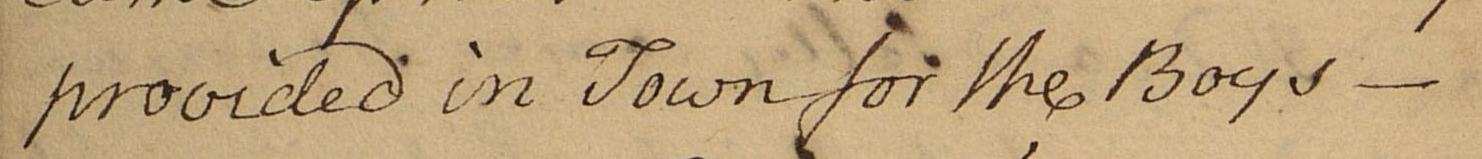provided in Town for the Boys-
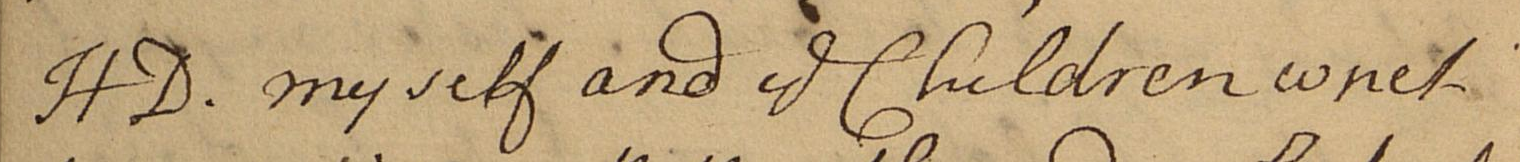H D. myself and y^e Children wnet
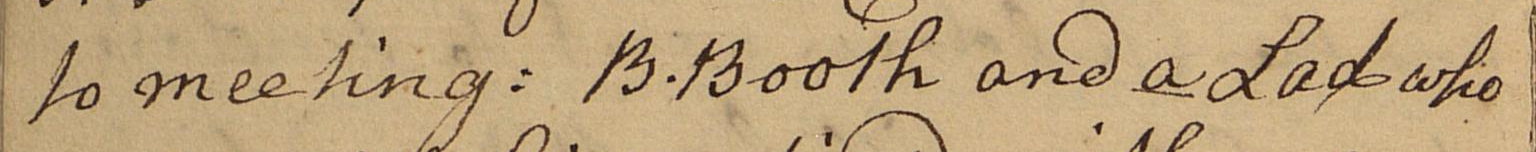to meeting: B. Booth and a Lad who
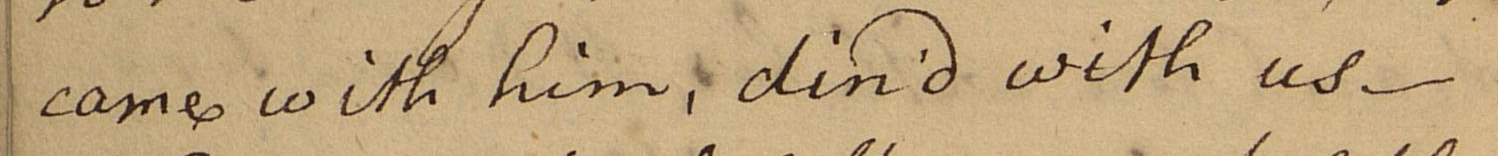came with him, din'd with us-
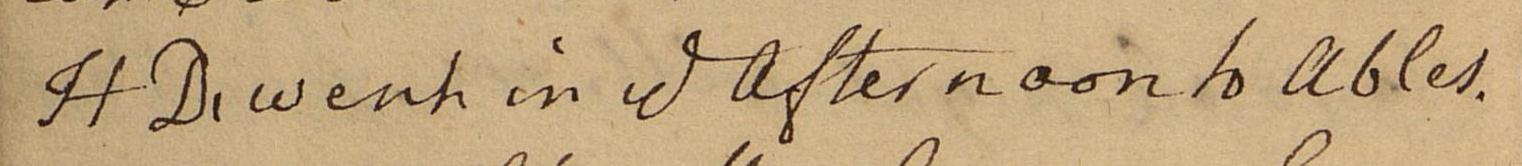HD. went in y^e Afternoon to Ables.
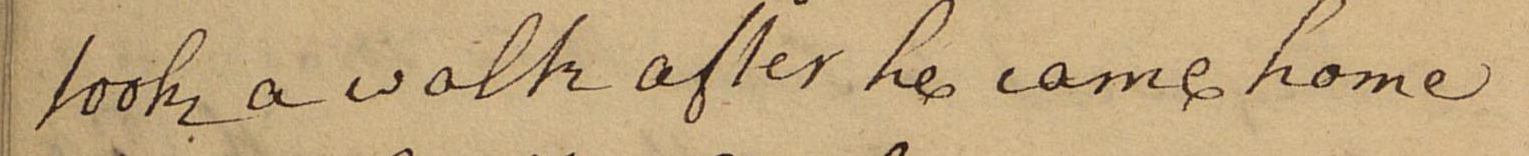took a walk after he came home
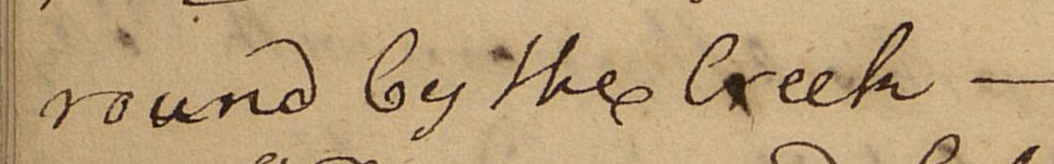round by the Creek-
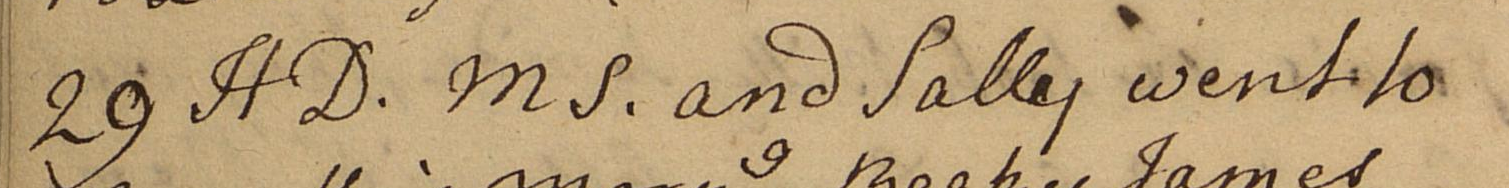29 H D. MS. and Sally went to
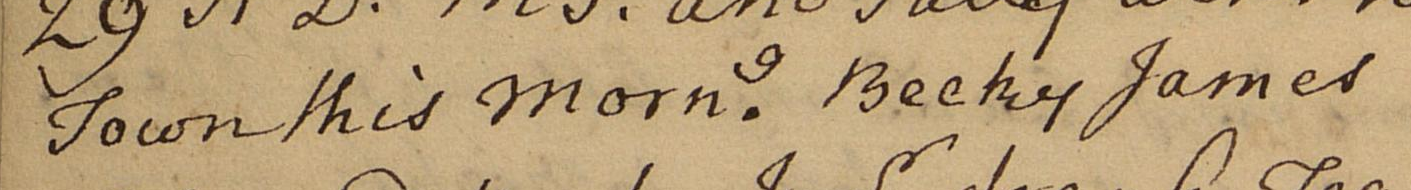Town this Morn^g Becky James
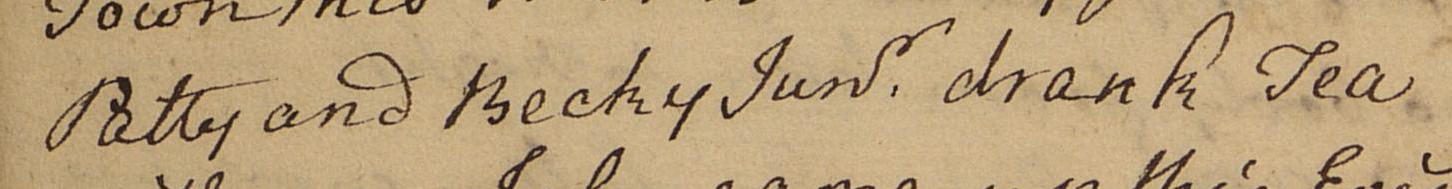Patty and Becky Jun^r. drank Tea
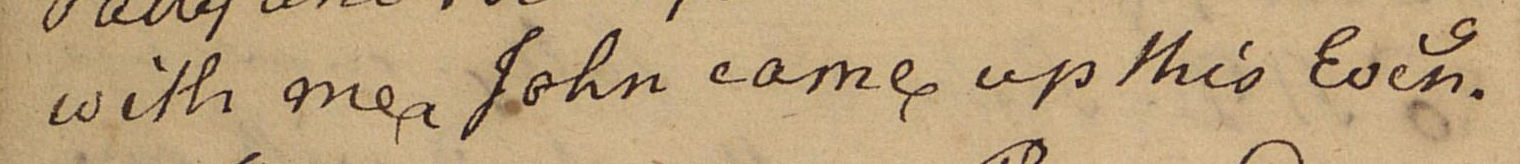with me John came up this Even^g.
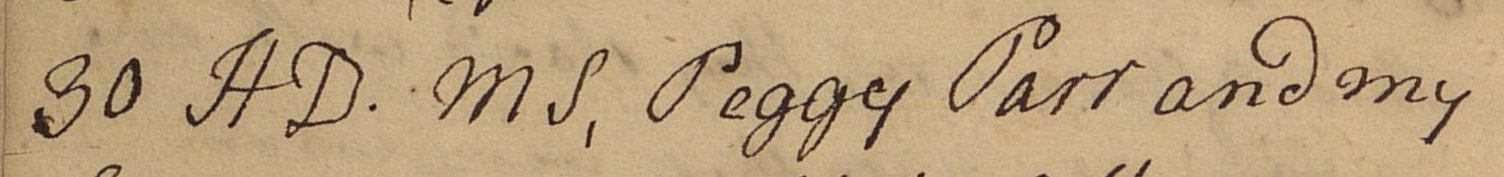30 H D. MS, Peggy Parr and my
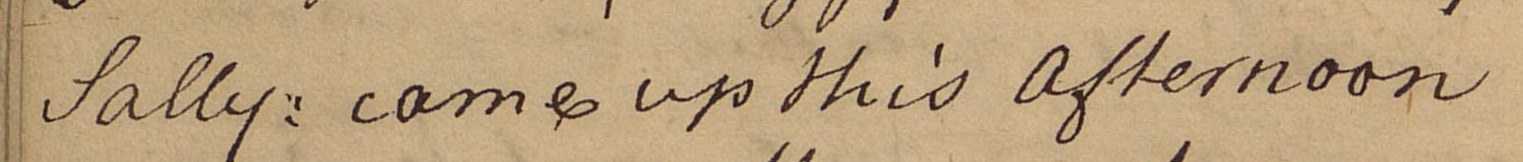Sally: came up this Afternoon
